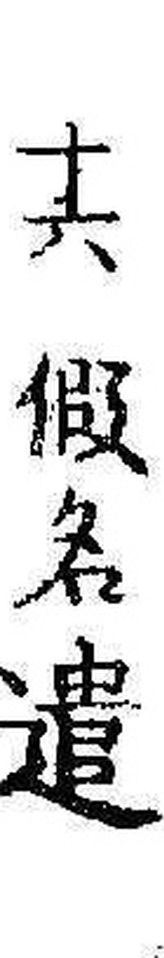十六仮名遣
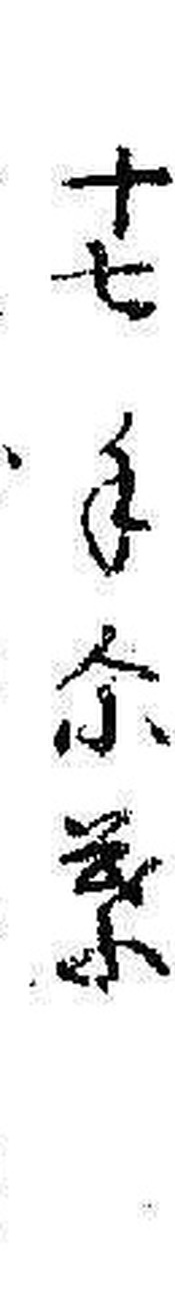十七手爾葉
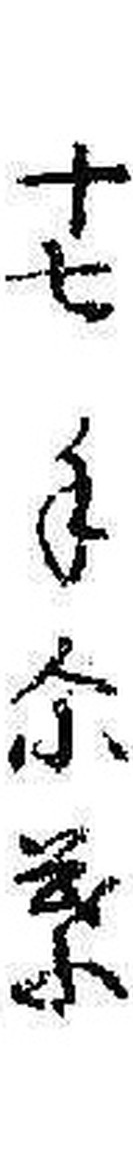十七手爾葉
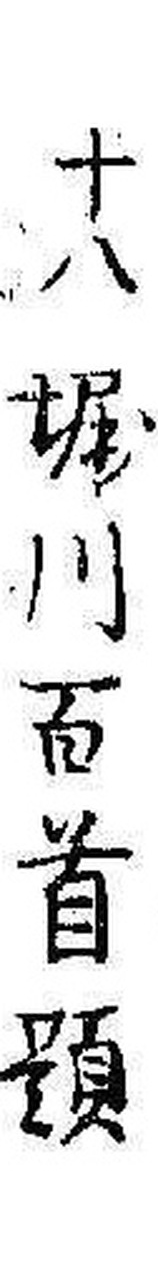十八堀川百首題
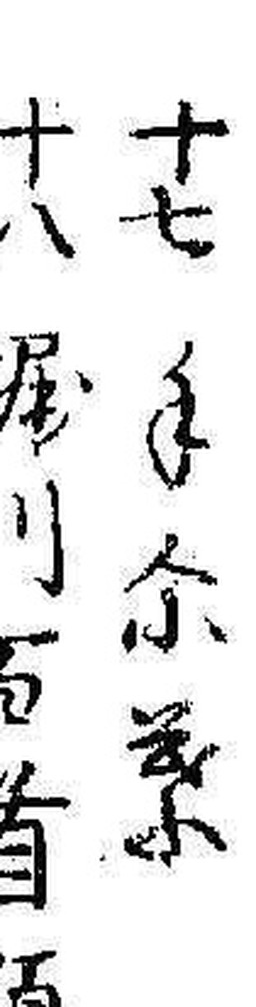十八堀川百首題
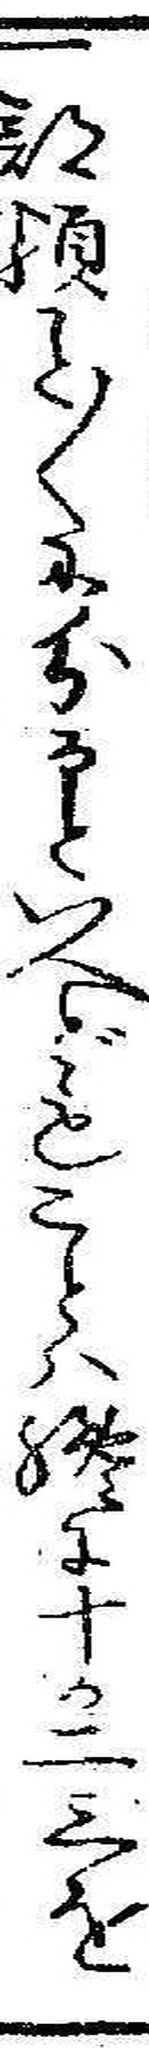一部類こと〳〵に分るといへどもことは纔に十か二三を
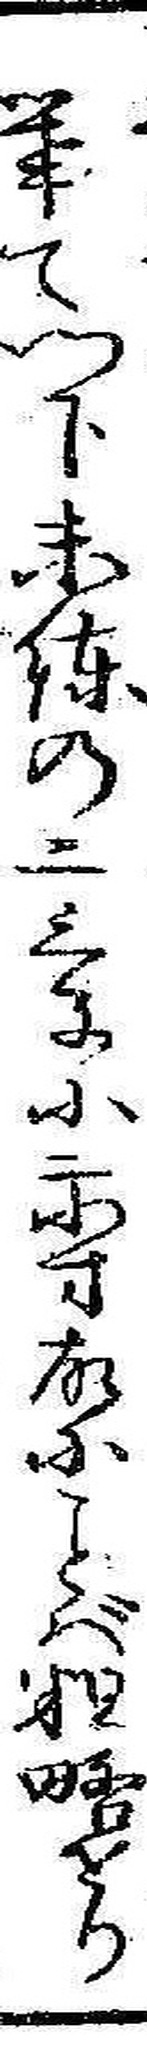筆て門下未練の二三子に示す故にことば粗略せり
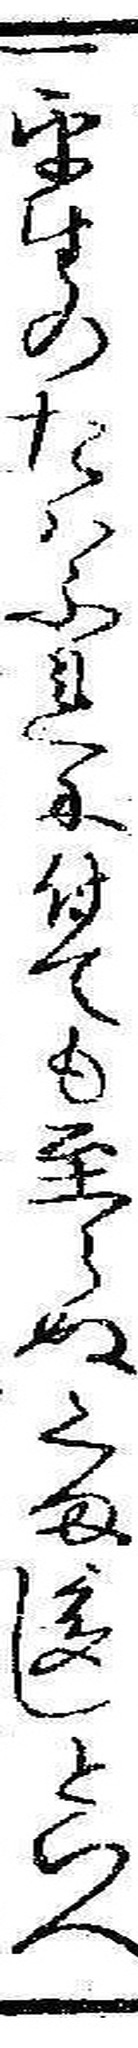一平生のたはふれに付ても至らぬくま多しといへ
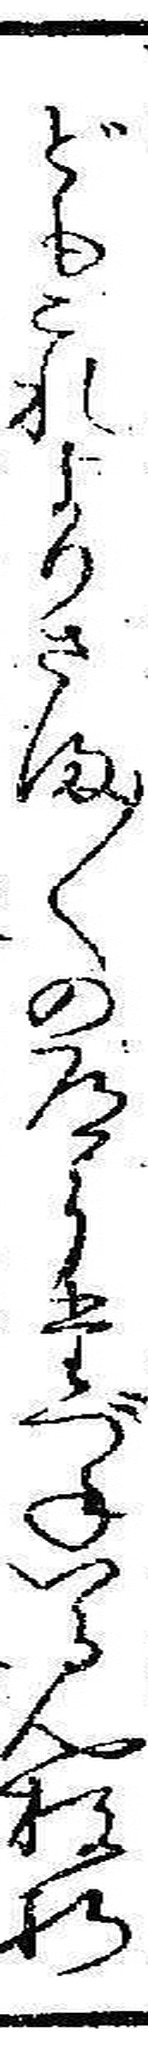どもこれよりさま〳〵の道にたづねいらん様？折
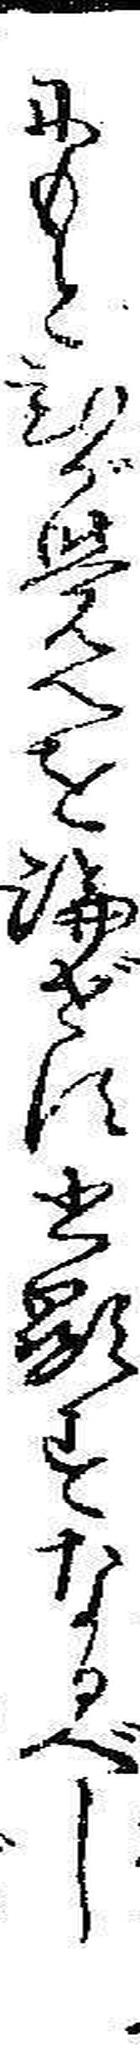にもとひが覚へを論ぜす書顕すなるべし
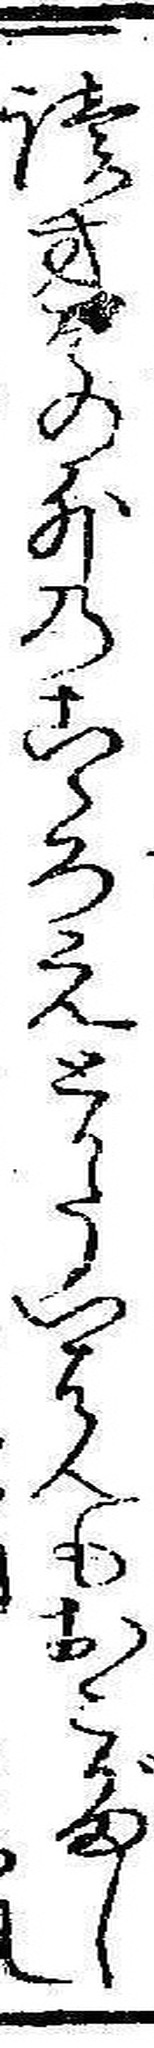一読方その外のこころえとかういはんもおこがまし
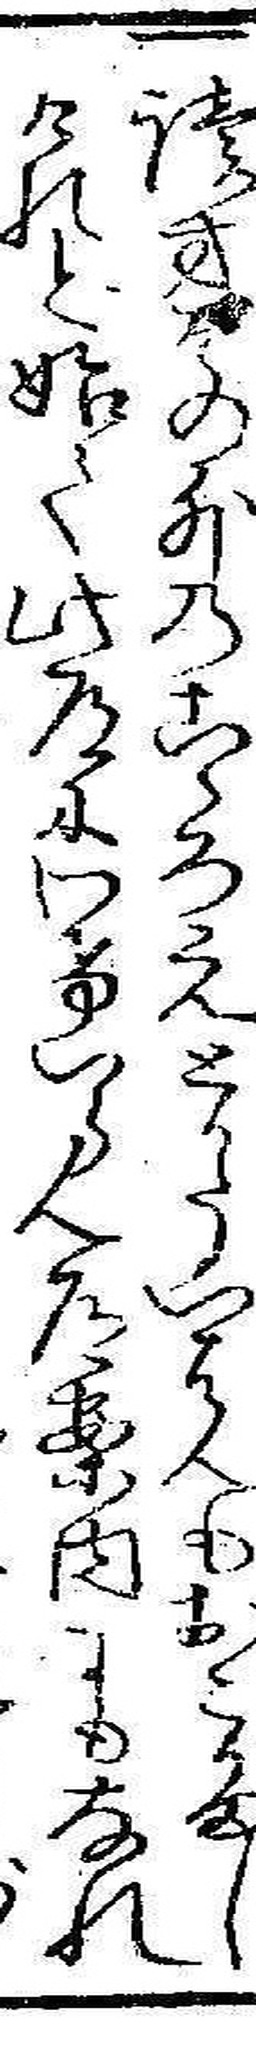けれと始て此道にわけいらん案内にもなれ
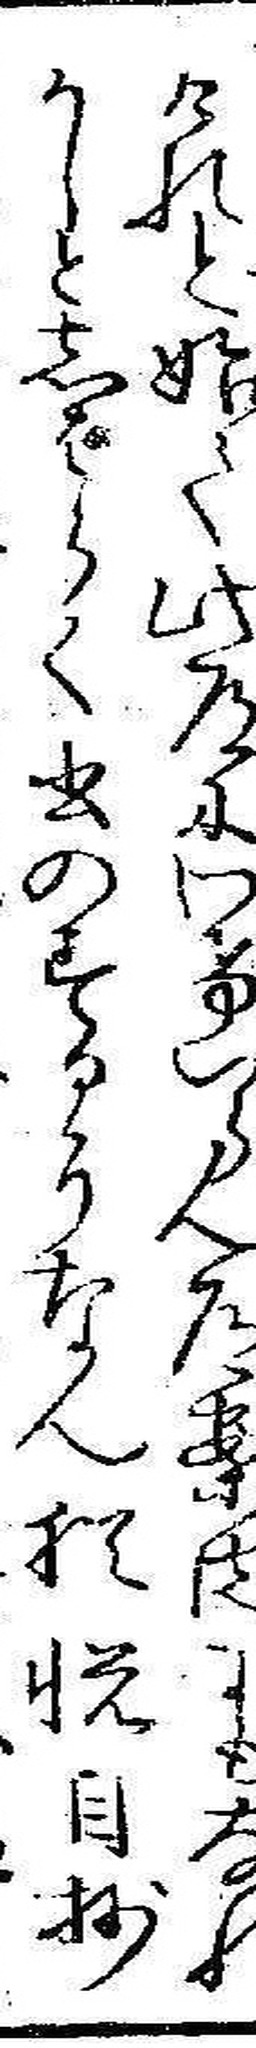かしとしばらく書のするになん猶悦目抄
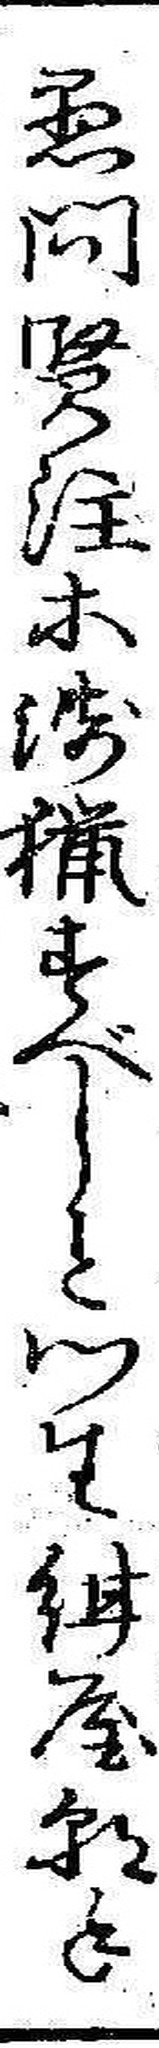愚問賢注等渉猟すべしと門生紺屋朝手
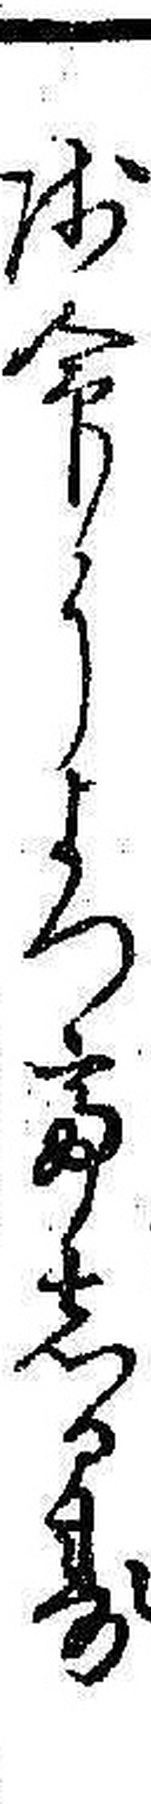残命によつてしるす

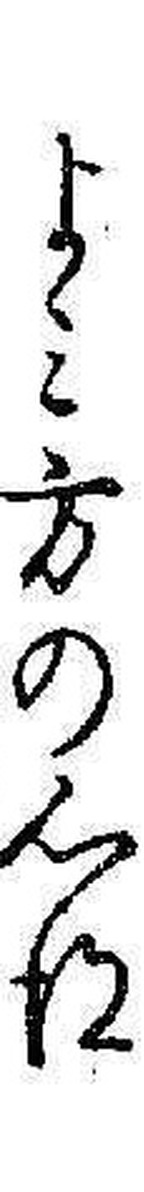よみ方の心得
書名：狂哥はまのきさご
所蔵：国文学研究資料館
